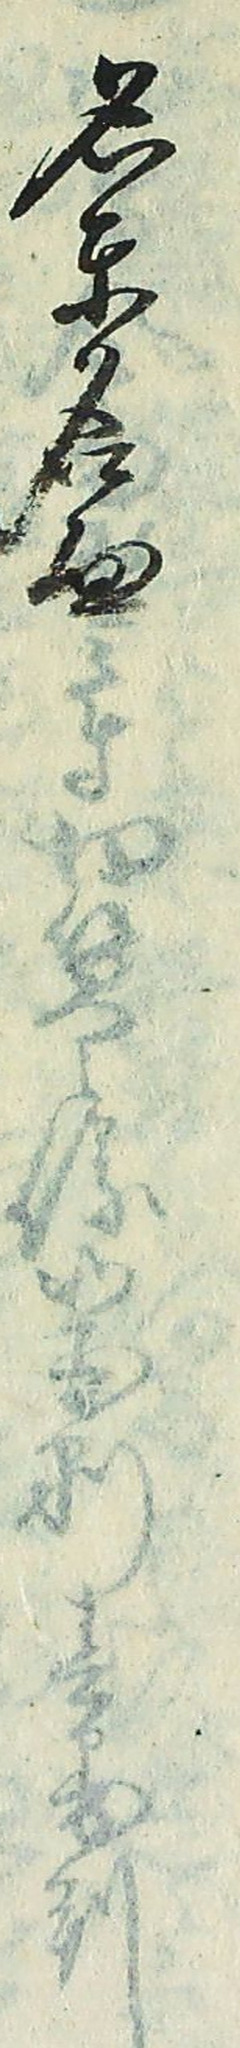名東名西
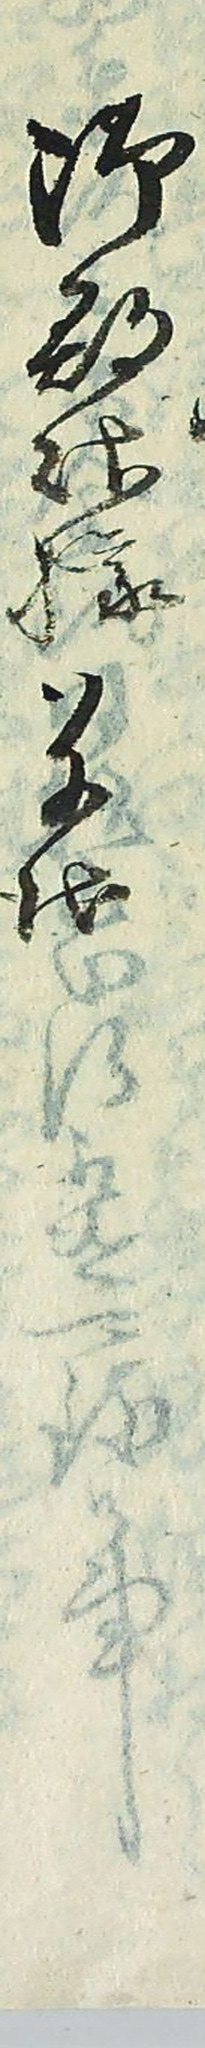御郡代様御手代
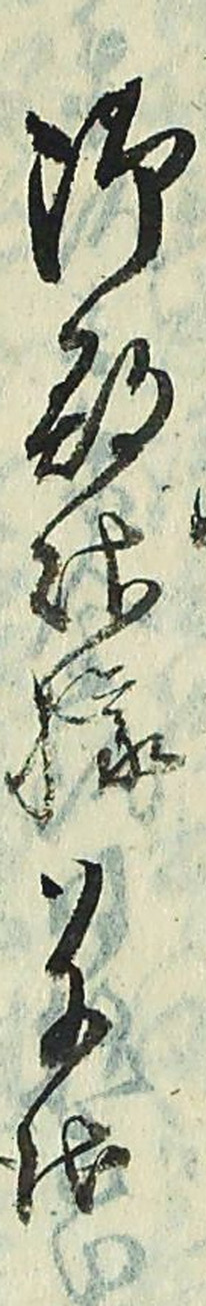御郡代様御手代
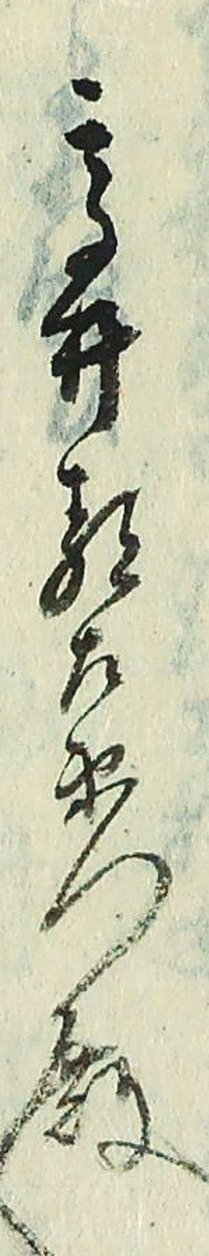高井類左衛門殿
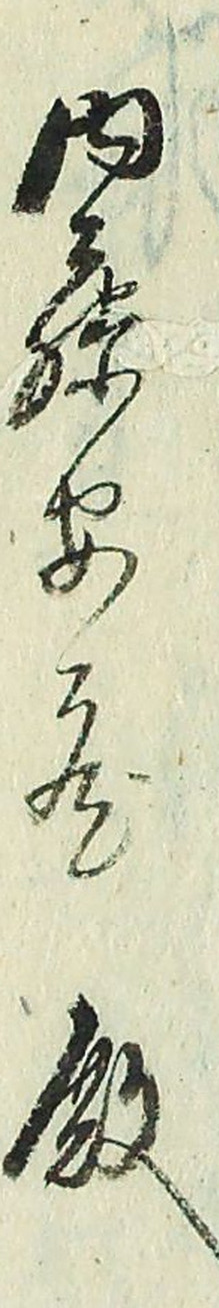内藤安蔵殿
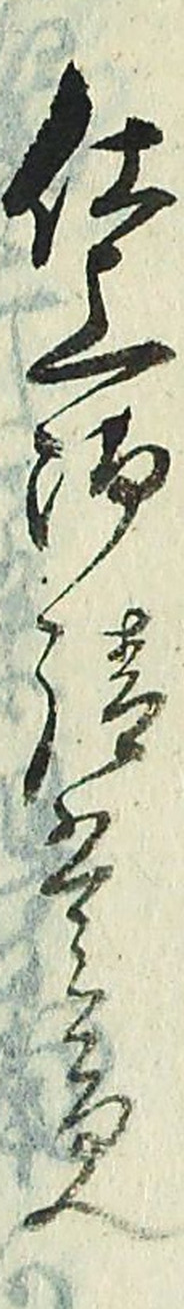仕上御請書之覚
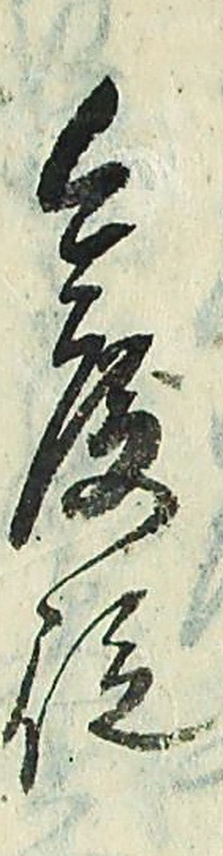今度従
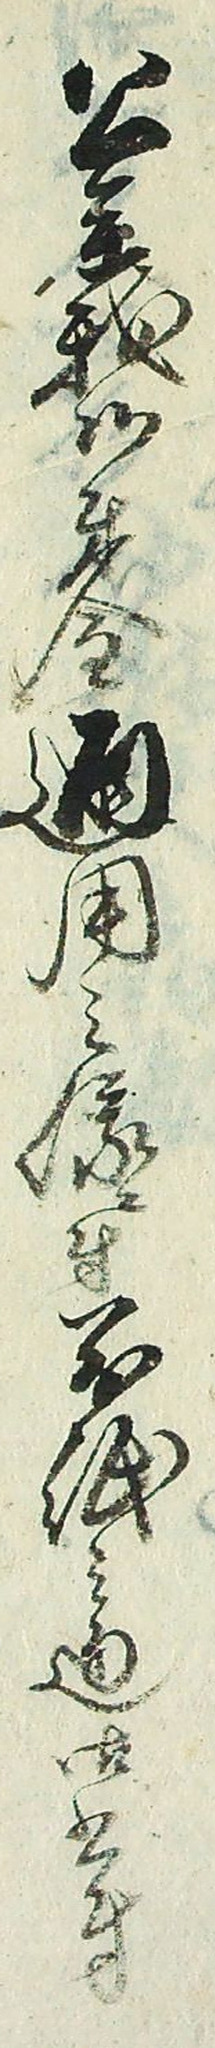公義弐朱金通用之儀に付別紙之通御書付
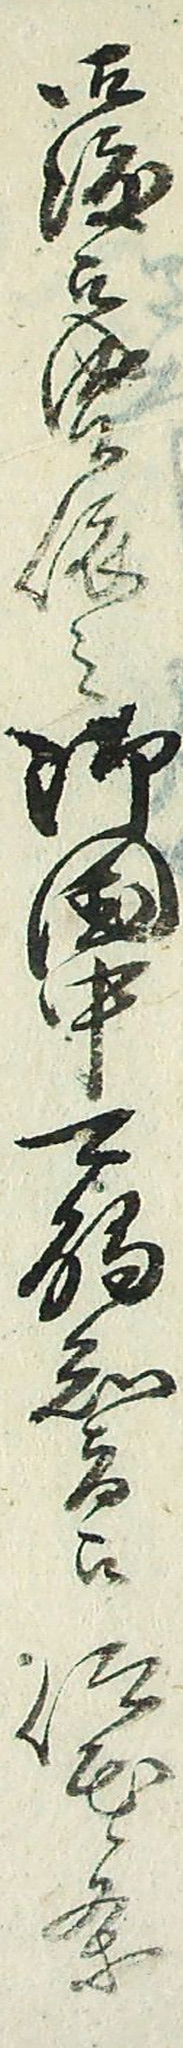御渡被成候依之御国中可触知旨被仰出候条

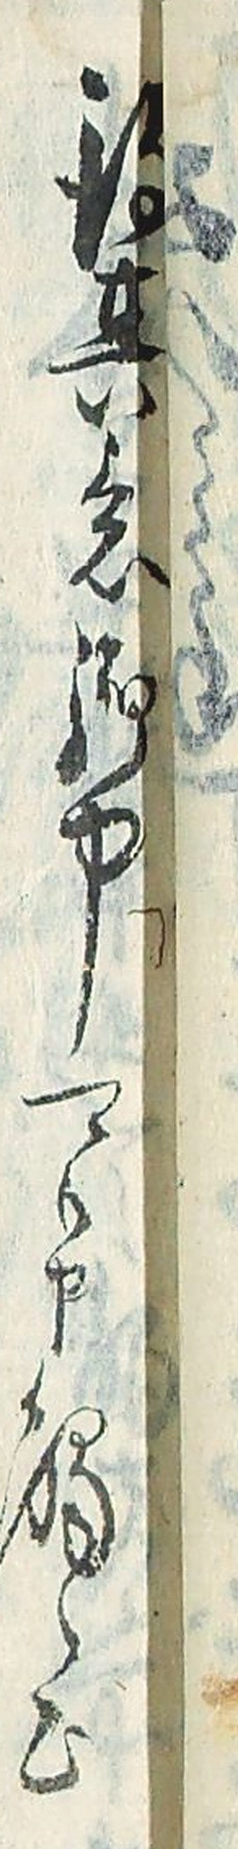得其意郷中可被申触候以上
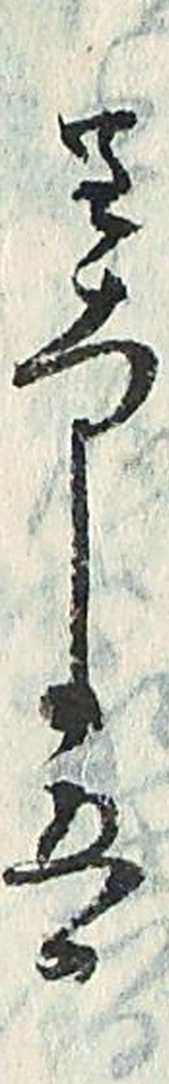閏十一月五日
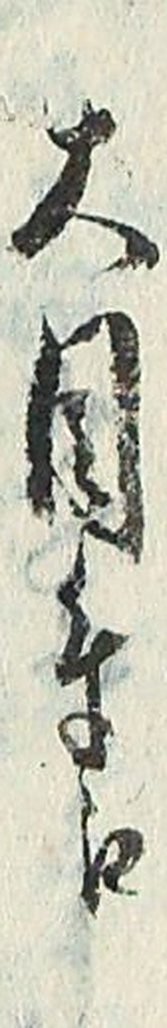大目付江
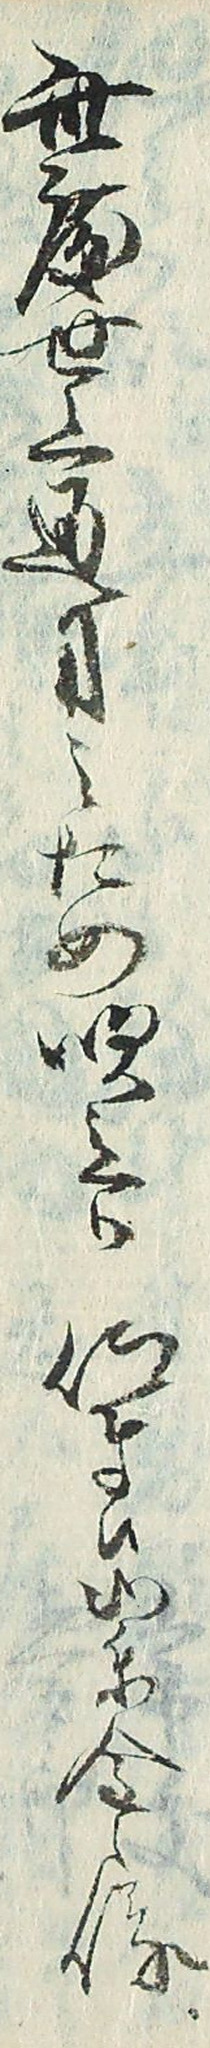此度世上通用之ため吹上被仰付候弐朱金之儀
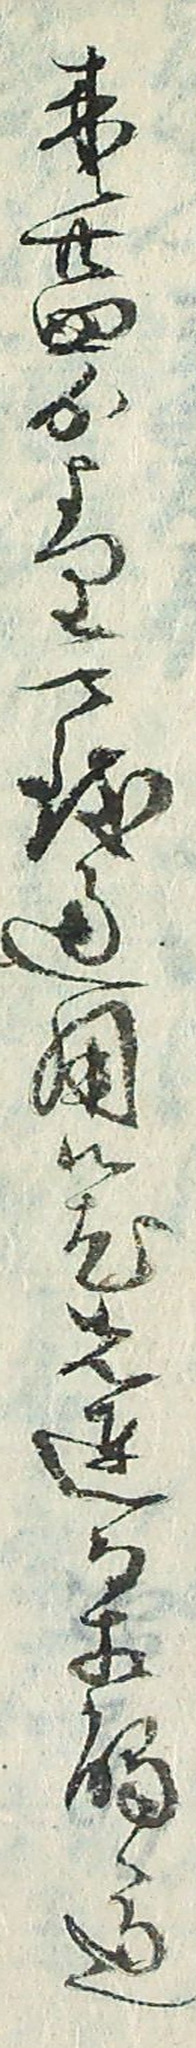来廿四ゟより可致通用候尤先達而相触候通
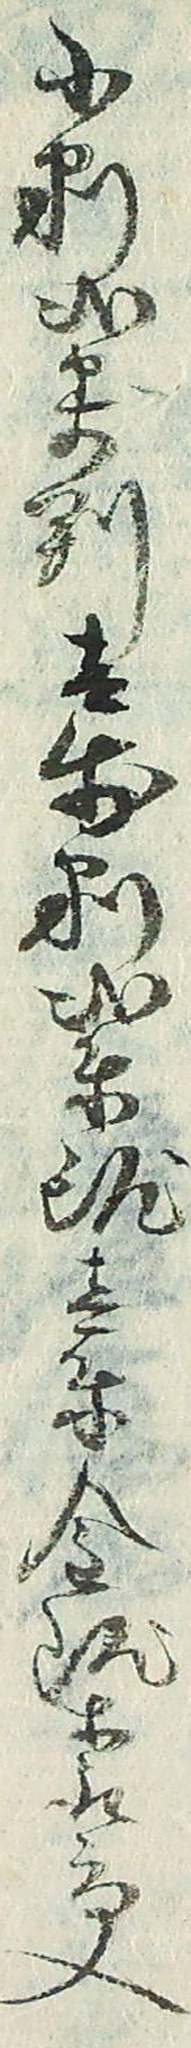小判弐歩判壱歩判弐朱銀壱朱金銀等相取交
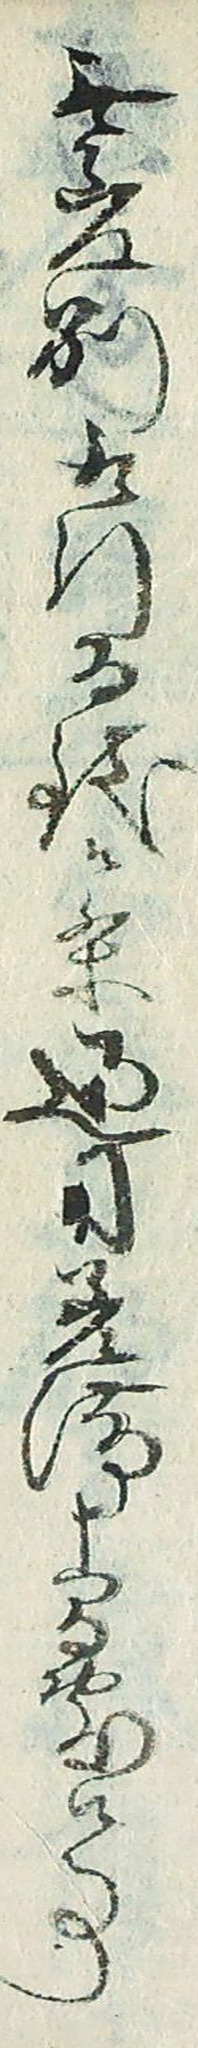無差別取引為致候条通用差滞申間敷候事
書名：諸御用御□受書控
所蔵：鳴門教育大学 Naruto University of Education
